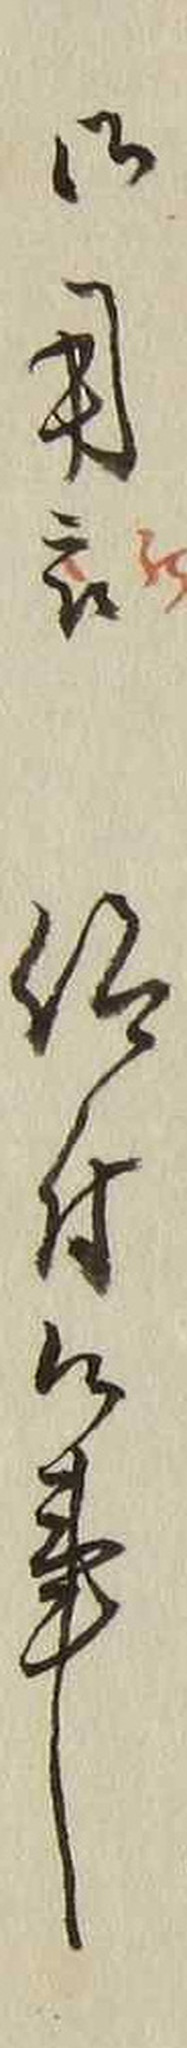御雇被仰付候事
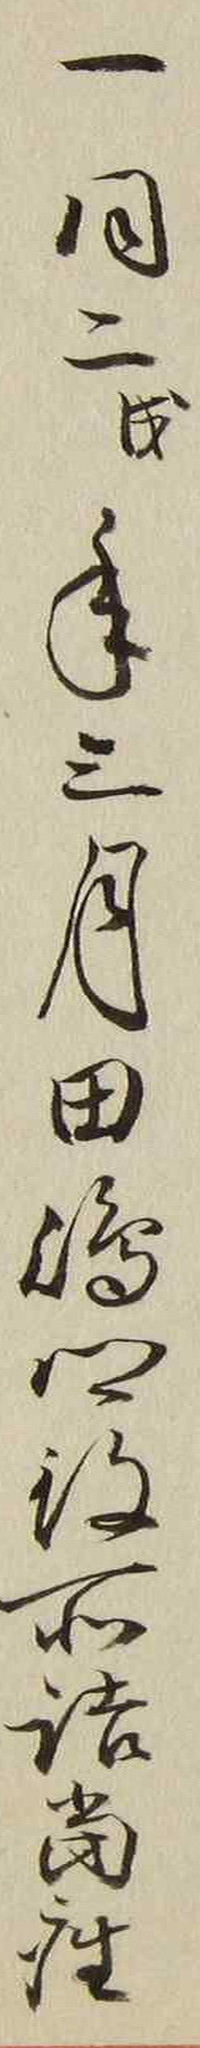一同二戌年三月田島郷役所詰当座
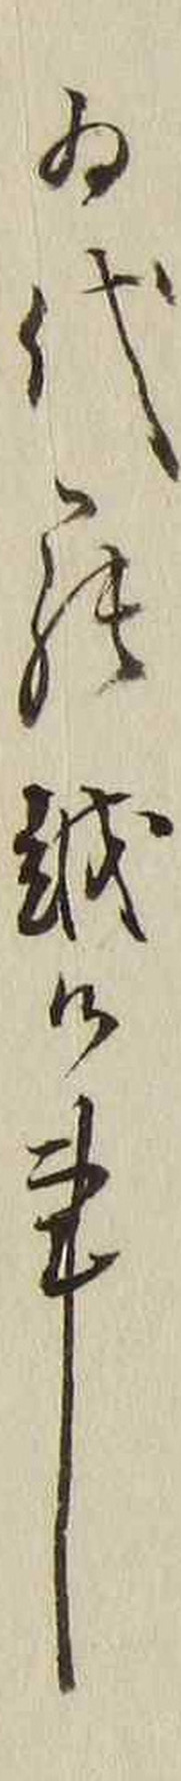為代罷越候事

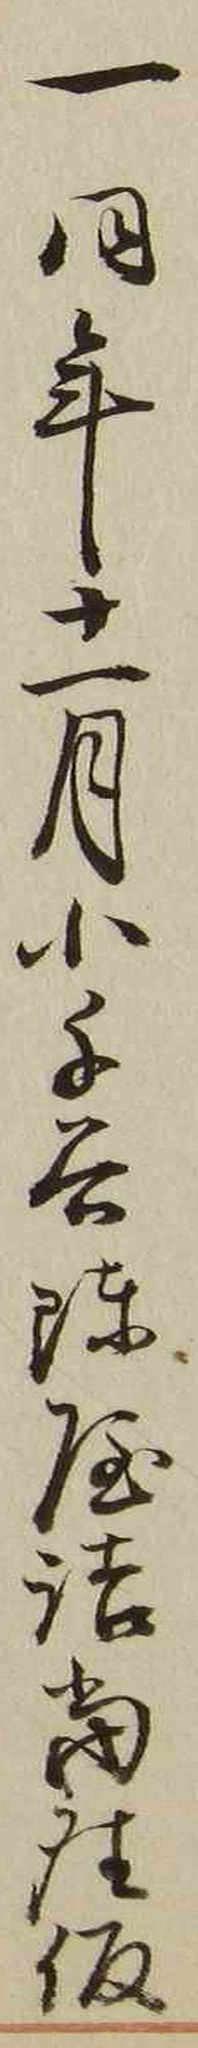一同年十一月小千谷陣屋詰当座仮
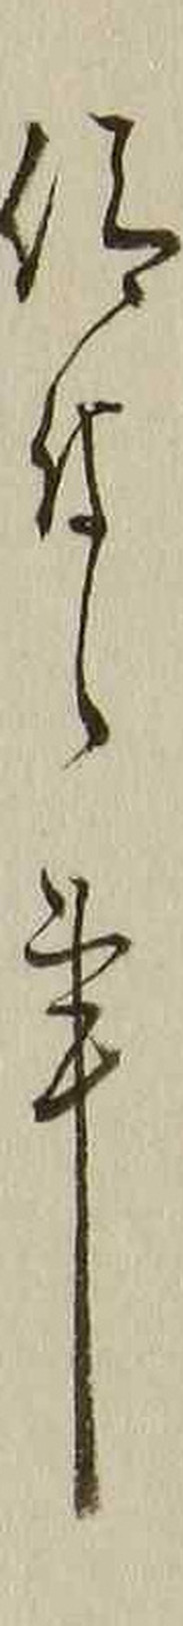仰付候事
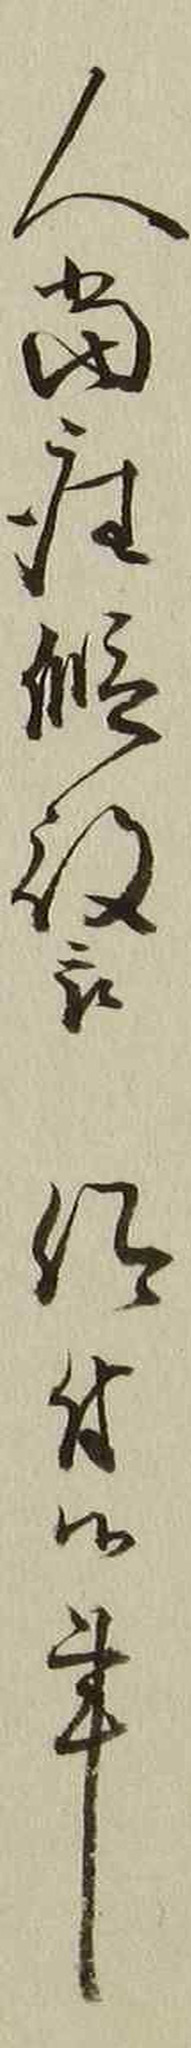人当座仮役被仰付候事
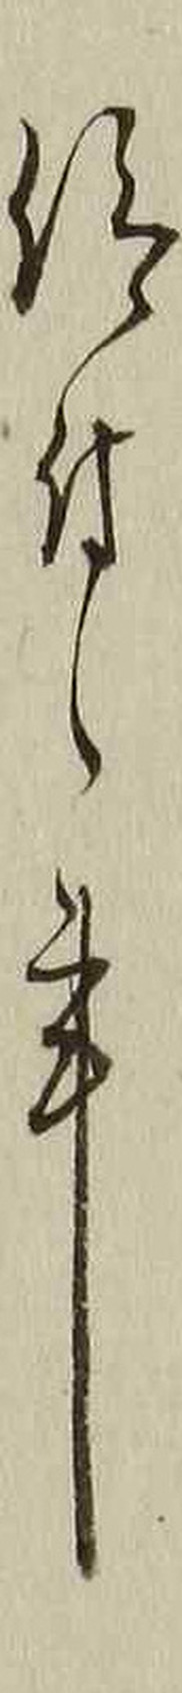仰付候事
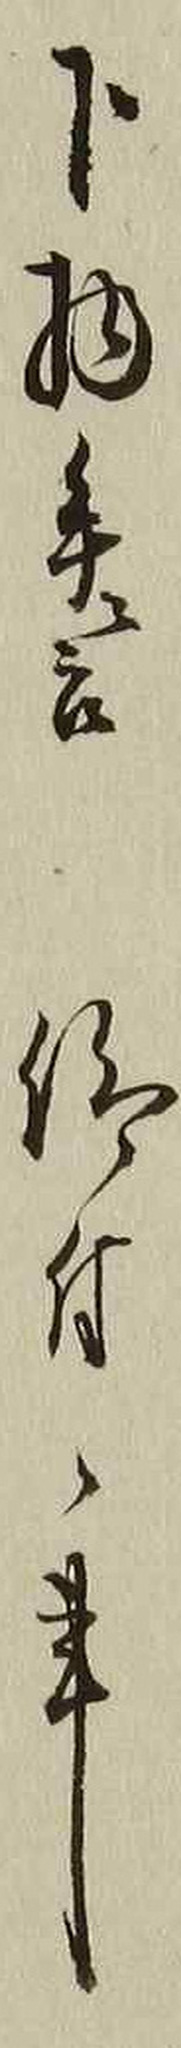下物書ニ被仰付候事
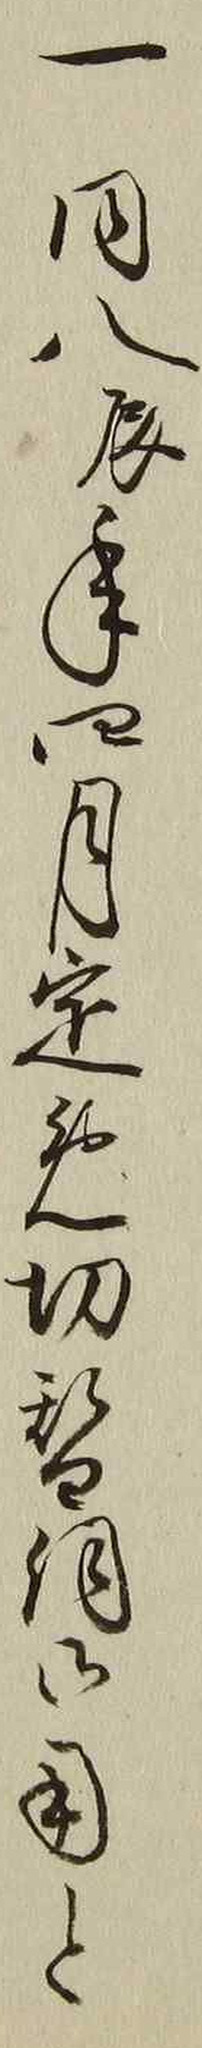一同八辰年四月定免切替伺御用と
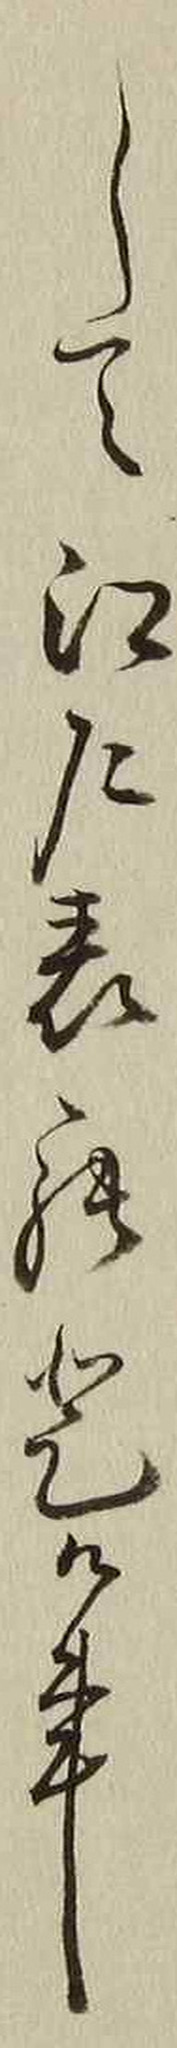して江戸表罷登候事
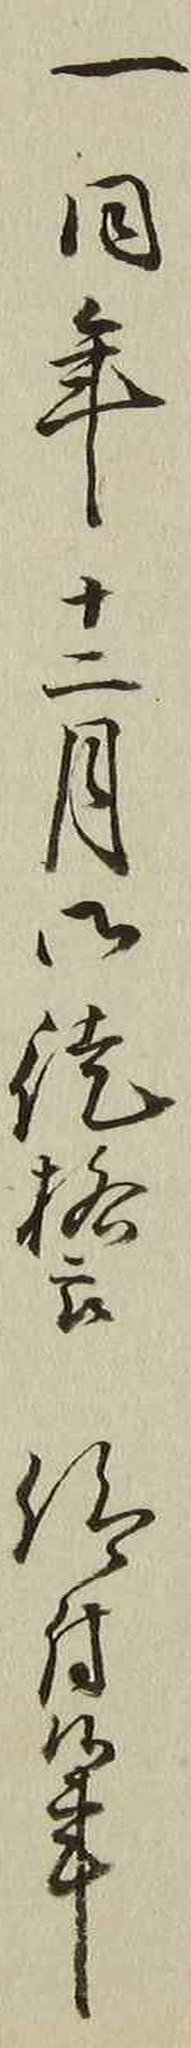一同年十二月御徒格被仰付候事
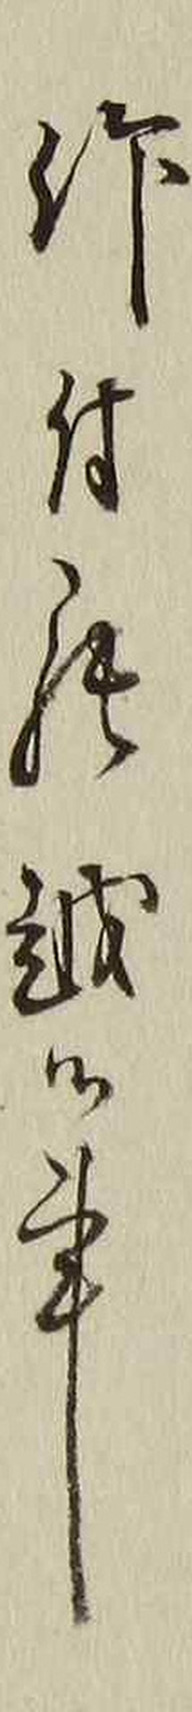仰付罷越候事
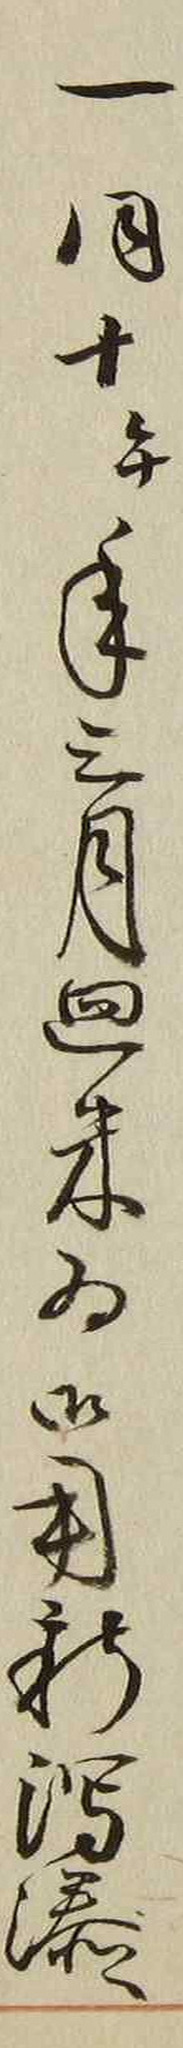一同十午年三月廻米為御用新潟湊へ
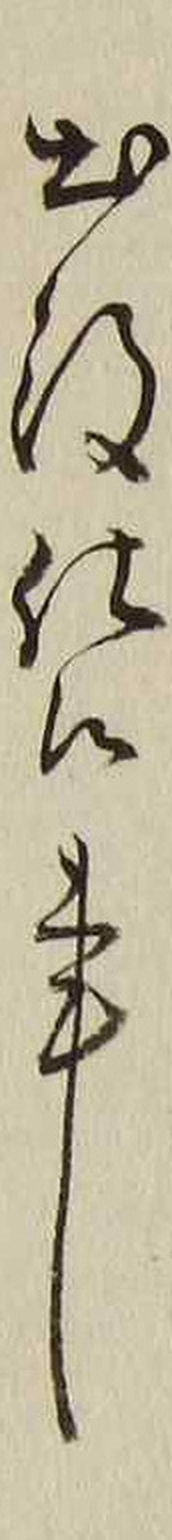出役仕候事
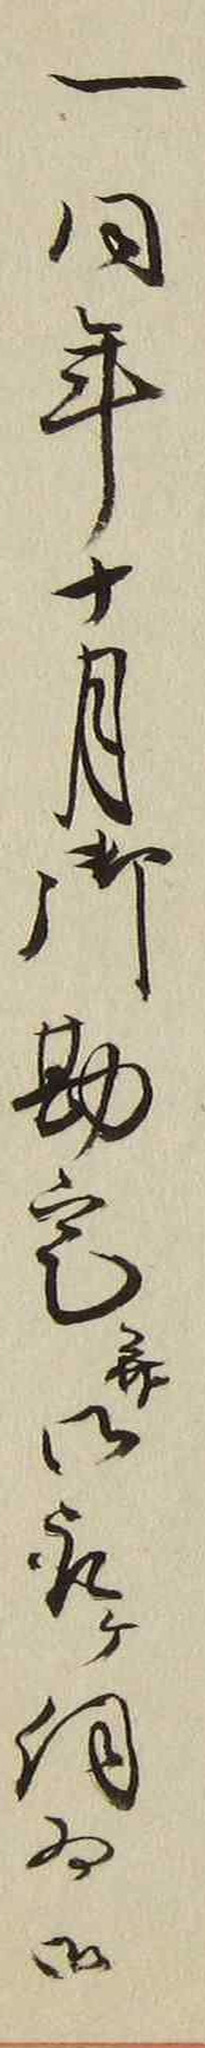一同年十月御勘定并御取ヶ伺為御
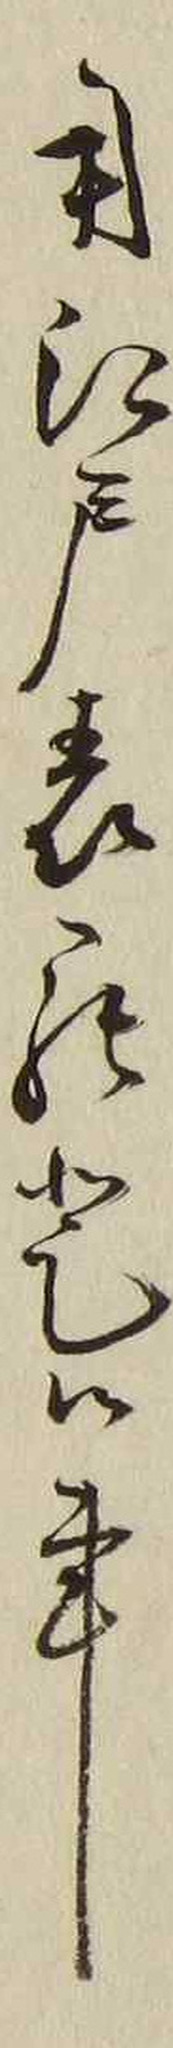用江戸表罷登侯事
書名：諸士系譜　巻之57　ほ之部4
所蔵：会津若松市立会津図書館
